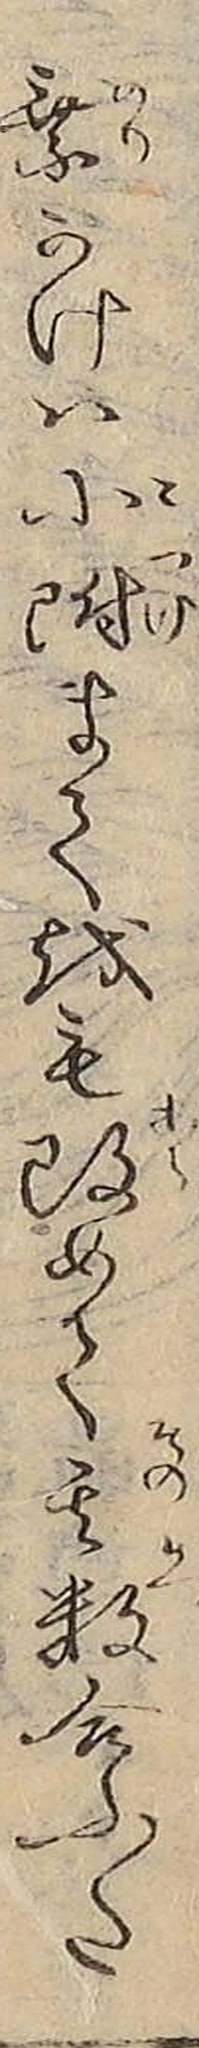乗かけは小附まてをも改めて其数合ふた
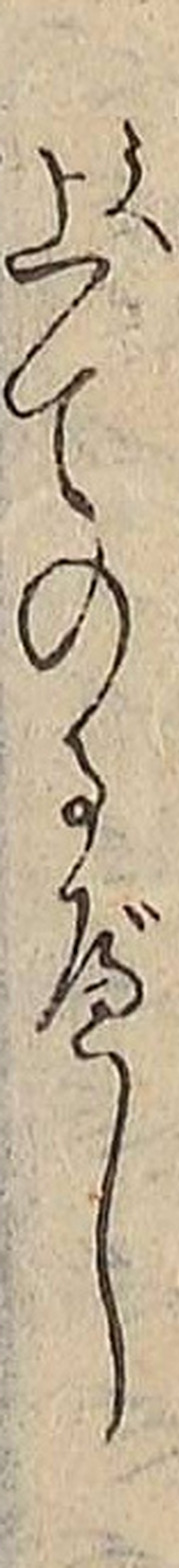上てのるべし
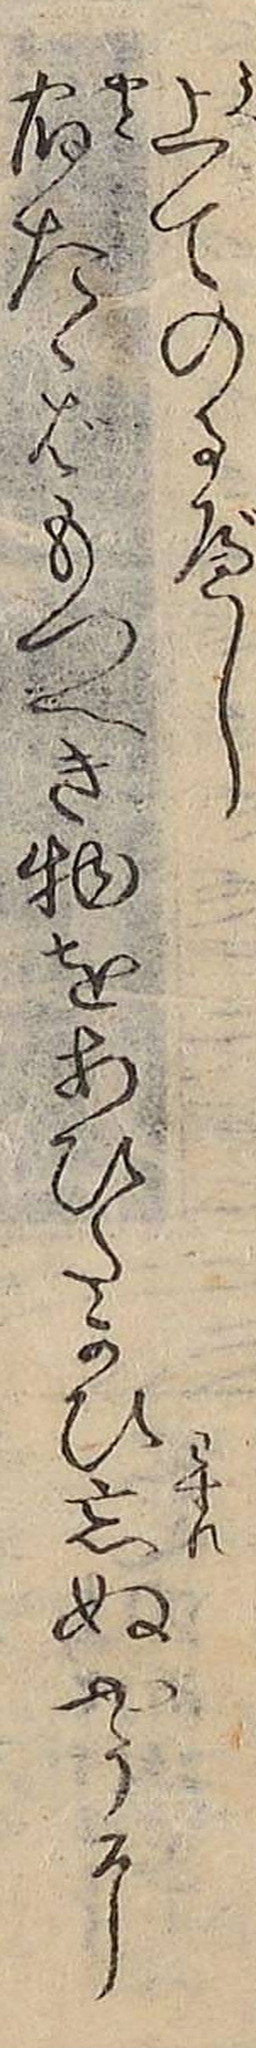宿たゝばもつへき物をあひたかひ忘ぬやうに
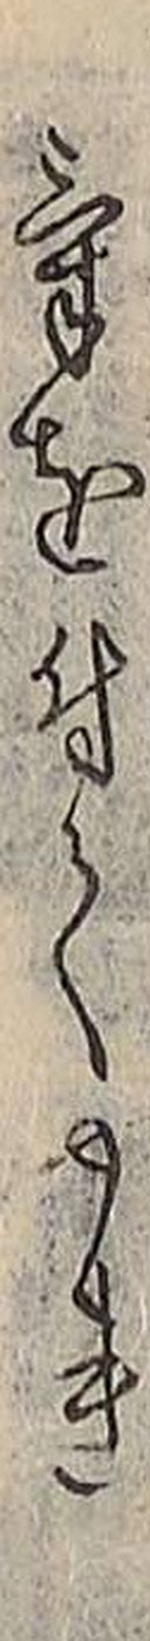気を付てやれ
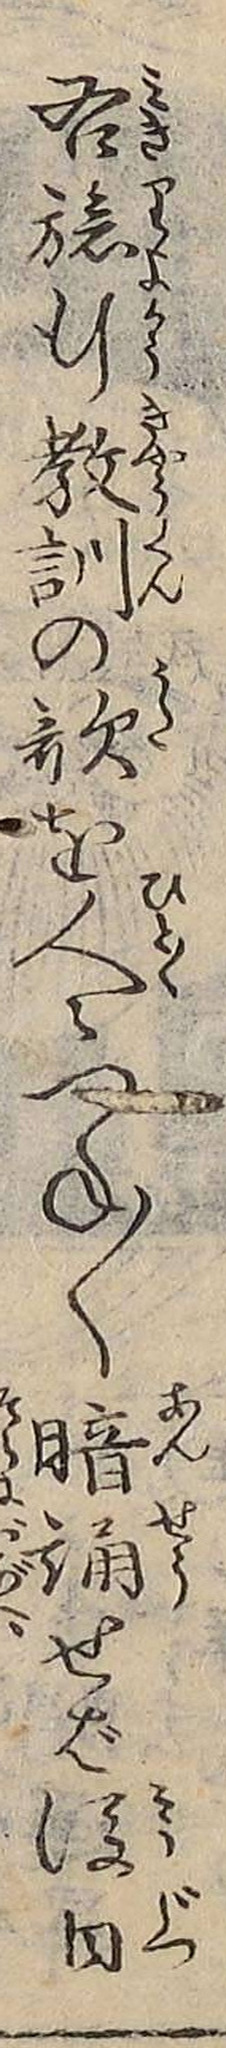右旅行教訓の歌を人々つね〳〵暗誦せば後日
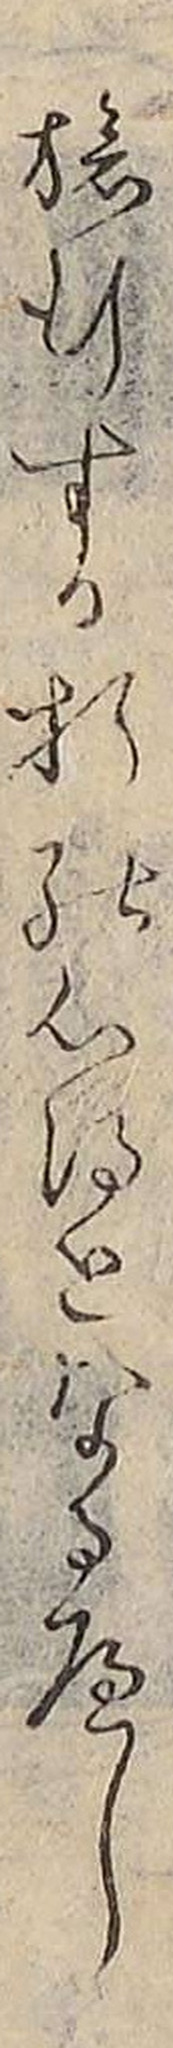旅行する折の心得となるへし
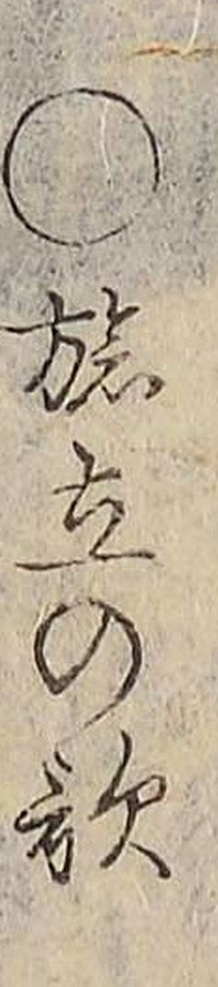○旅立の歌
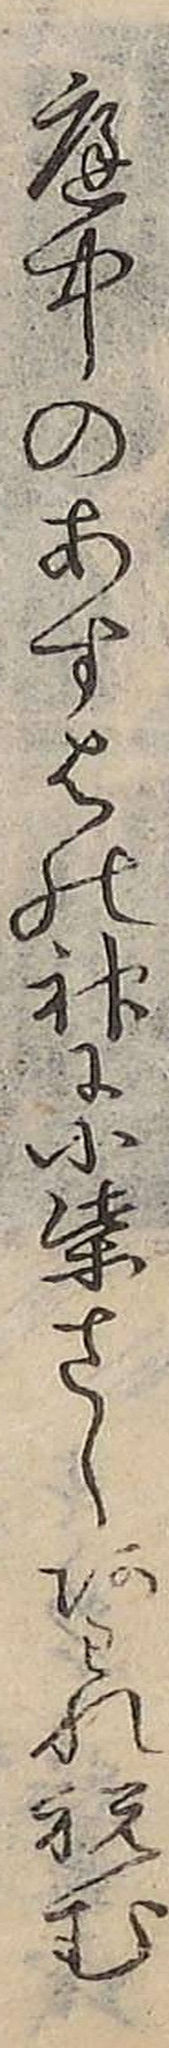庭中のあすはの神に小柴さしあわれ祝む
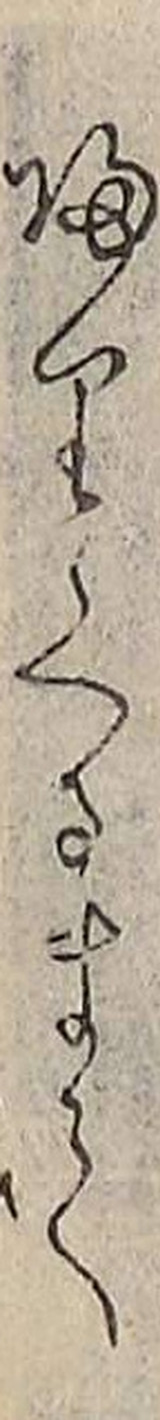帰りくるまて
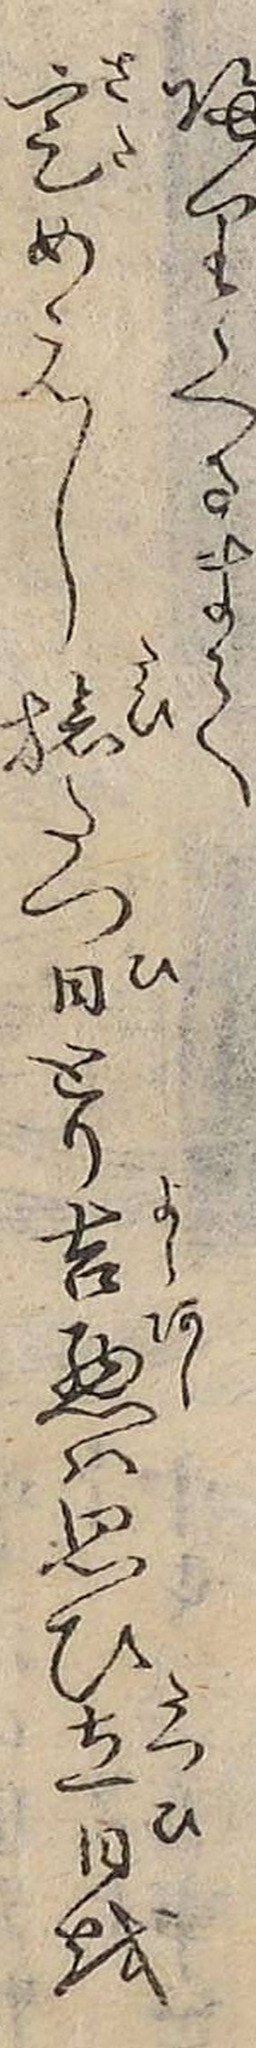定めえし旅たつ日とり吉悪は思ひ立日を
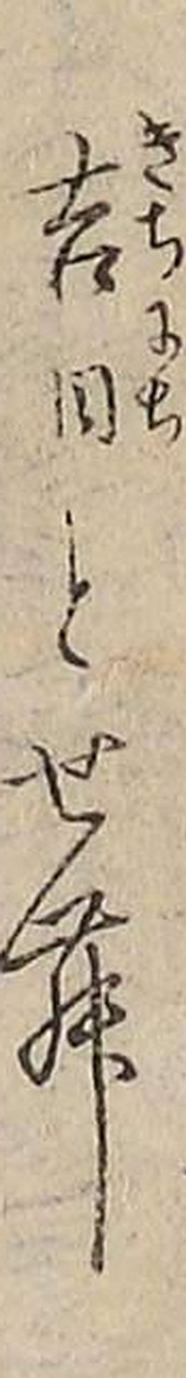吉日とせむ

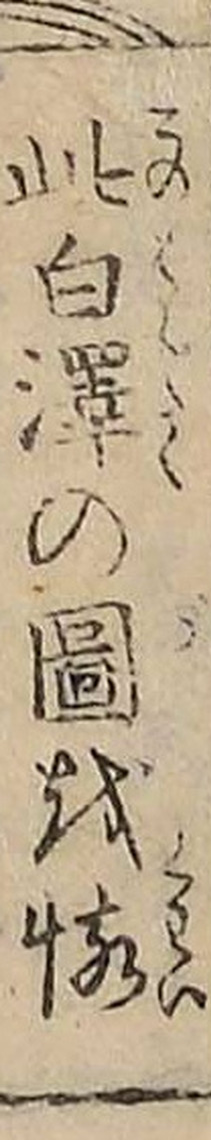此白沢の図を懐
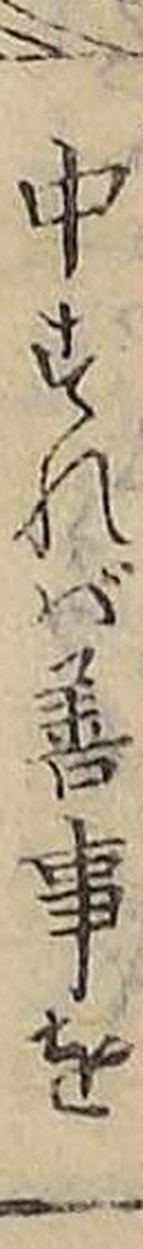中すれば善事を
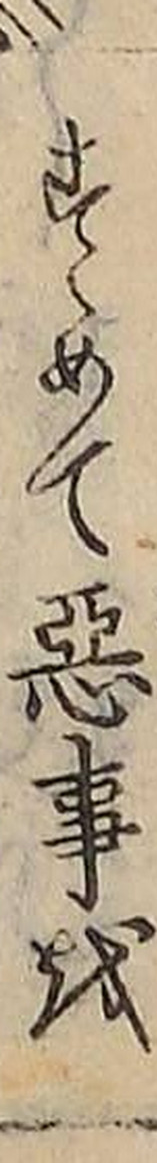すゝめて悪事を
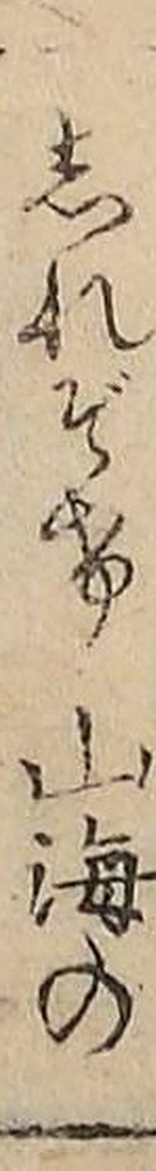しれぞけ山海の
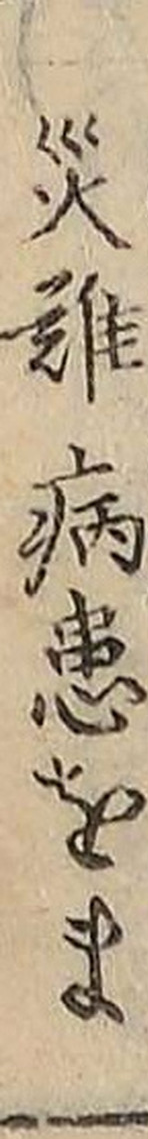災難病患をま
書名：旅行用心集
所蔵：神戸大学附属図書館 国文学研究資料館
